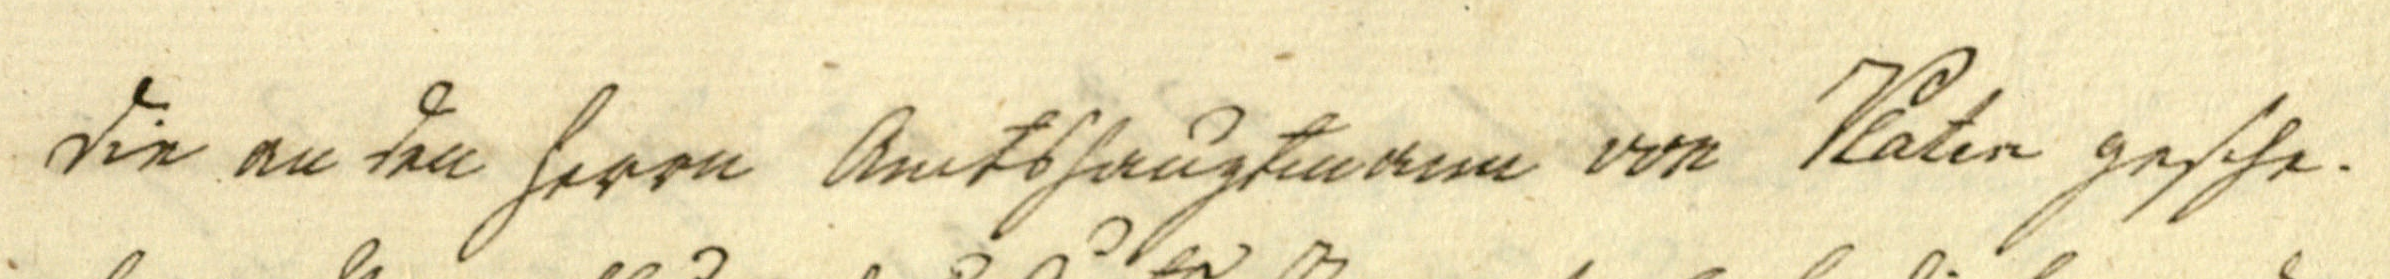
die an den Herrn Amtshauptmann von Platen gesche¬
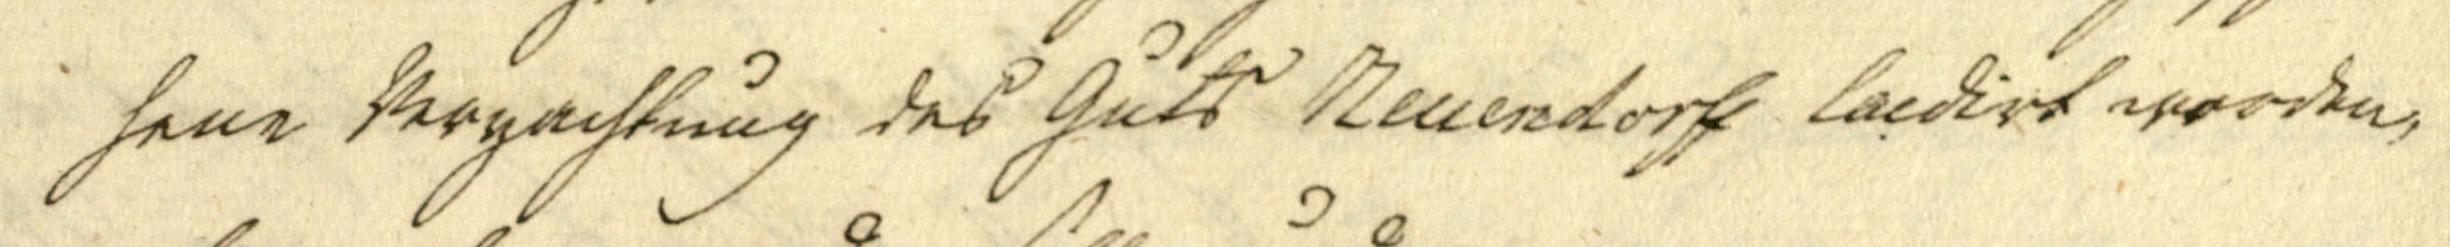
hene Verpachtung des Guts Neuendorff laedirt worden,
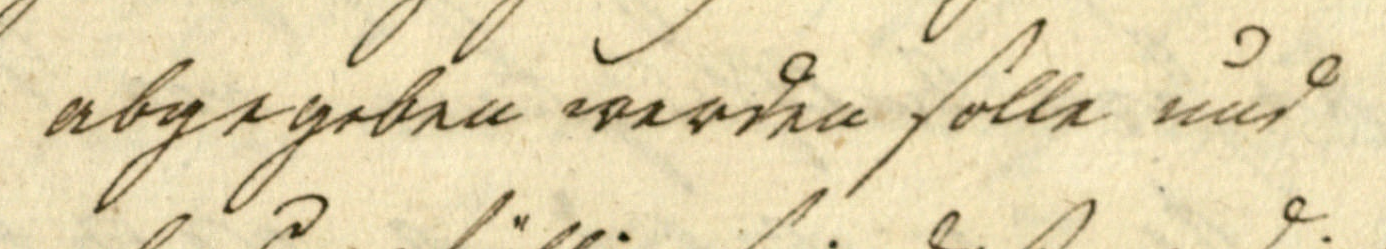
abgegeben werden solle und
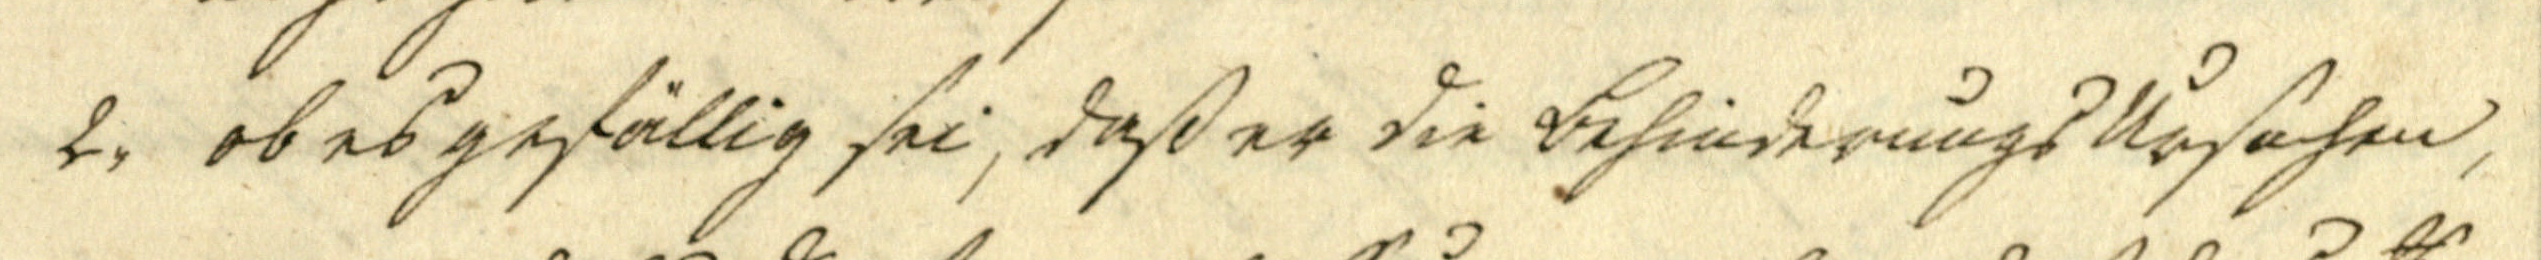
2., ob es gefällig sei, daß er die Behinderungs Ursachen,
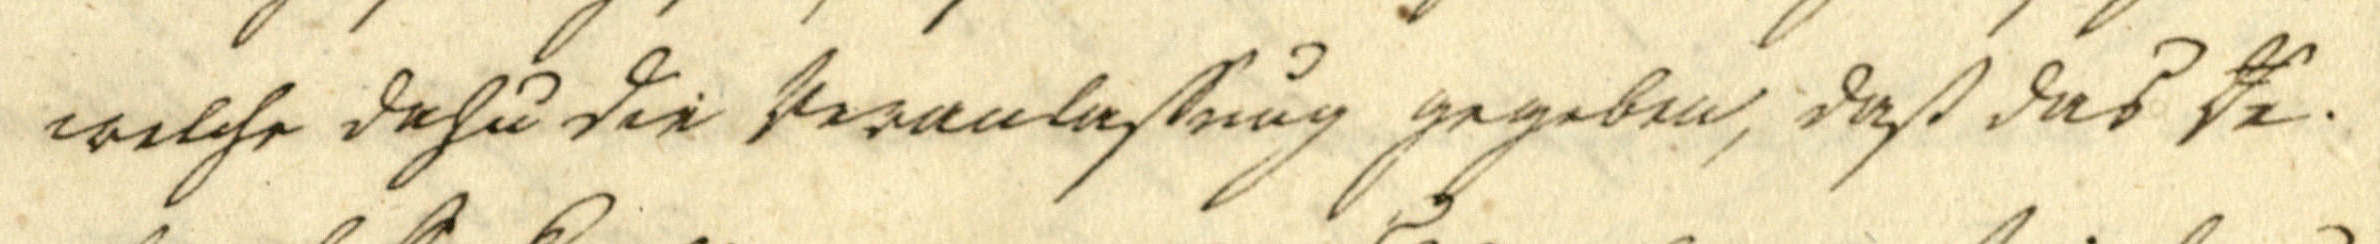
welche dazu die Veranlassung gegeben, daß das Re¬
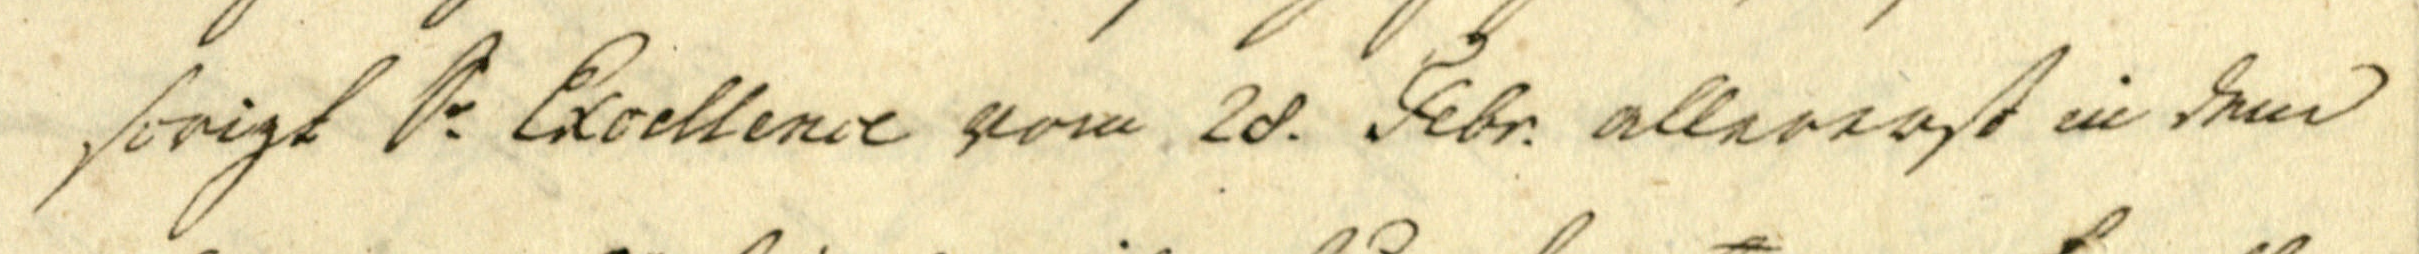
script Sr Excellence vom 28. Febr. allererst in dem
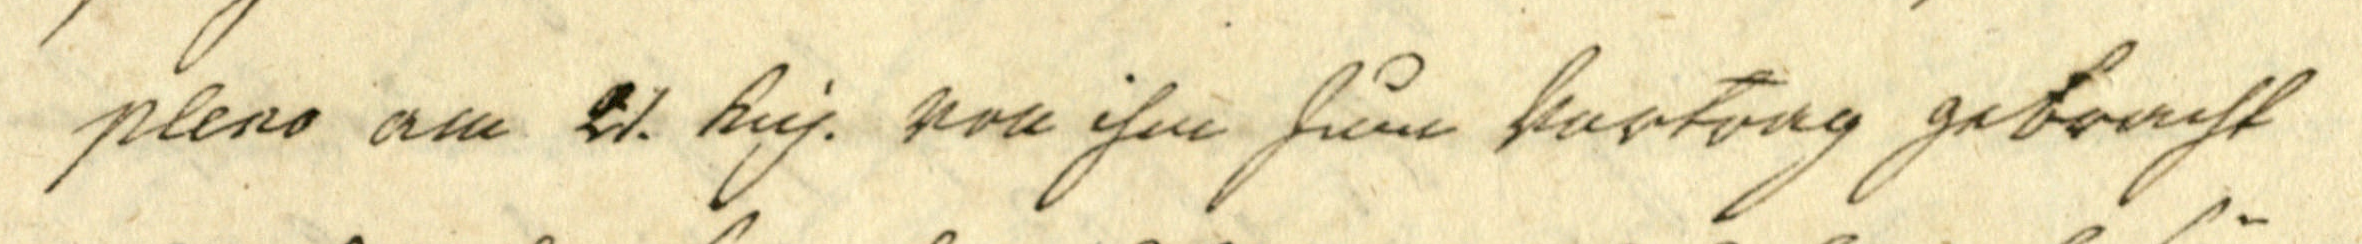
pleno am 21. huj. von ihm zum Vortrag gebracht
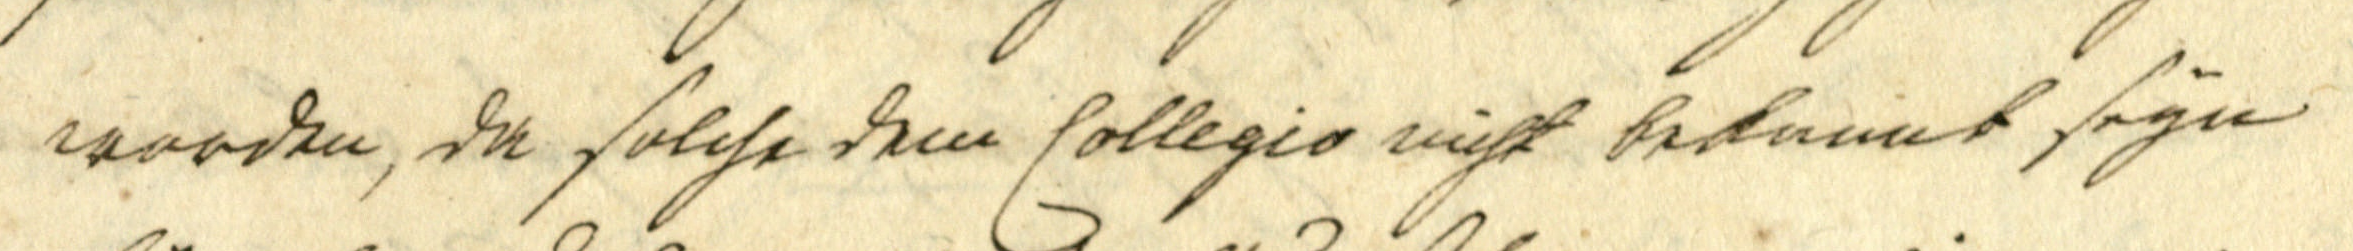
werden, da solche dem Collegio nicht bekannt seÿn
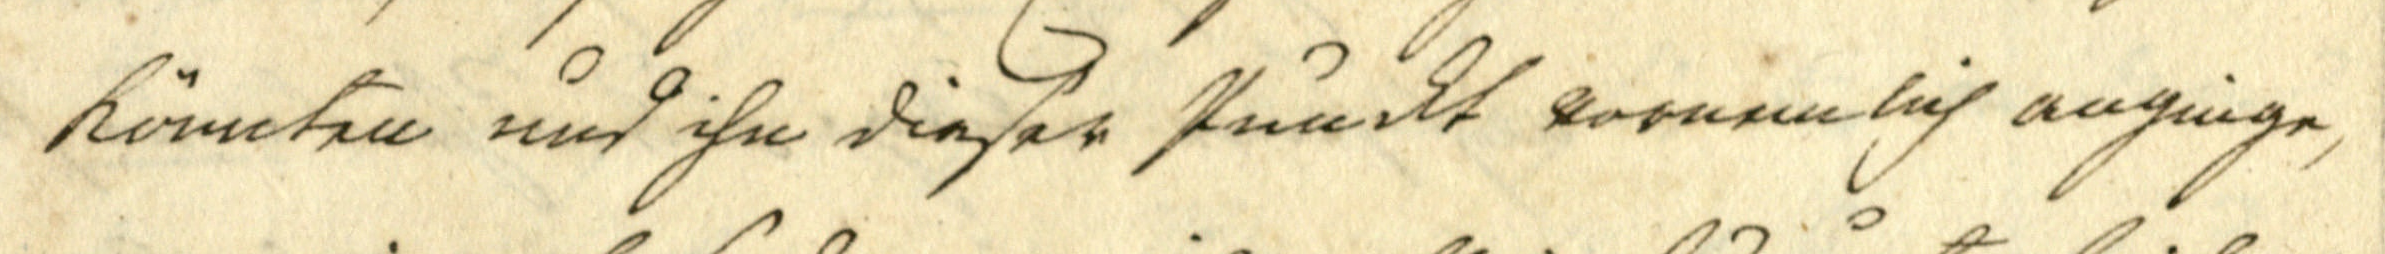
könnten und ihm dieser Punckt vornemlich anginge,
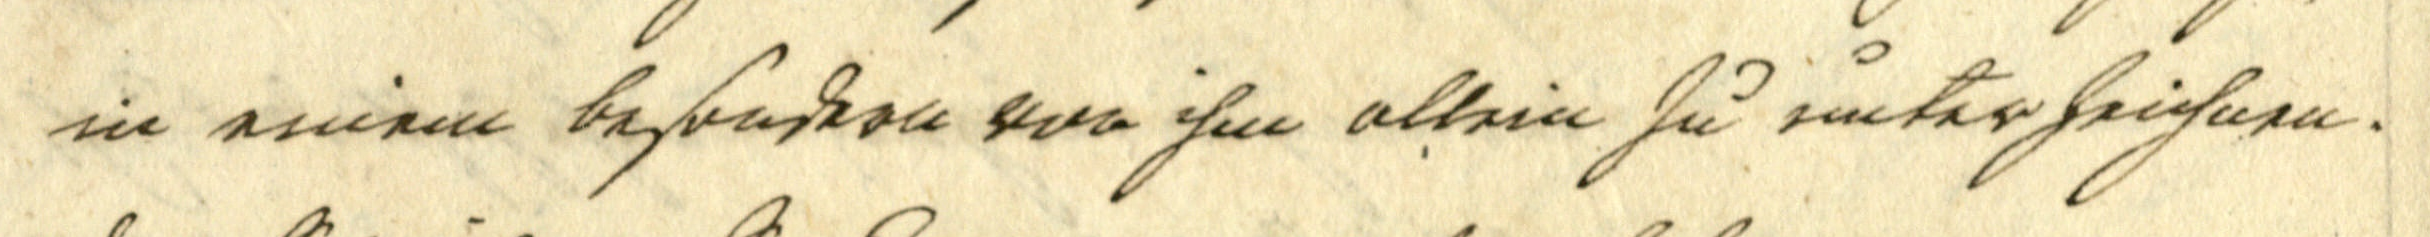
in einem besondern von ihm allein zu unterzeichnen¬
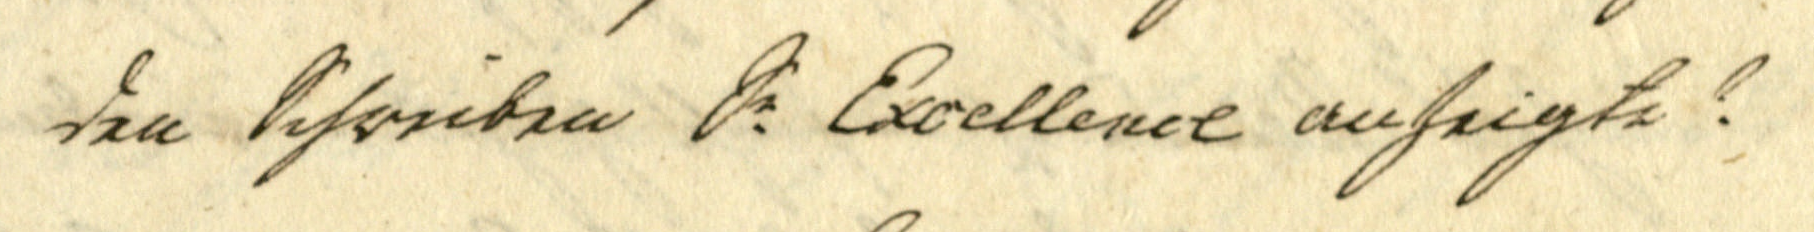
den Schreiben Sr. Excellence anzeigte?
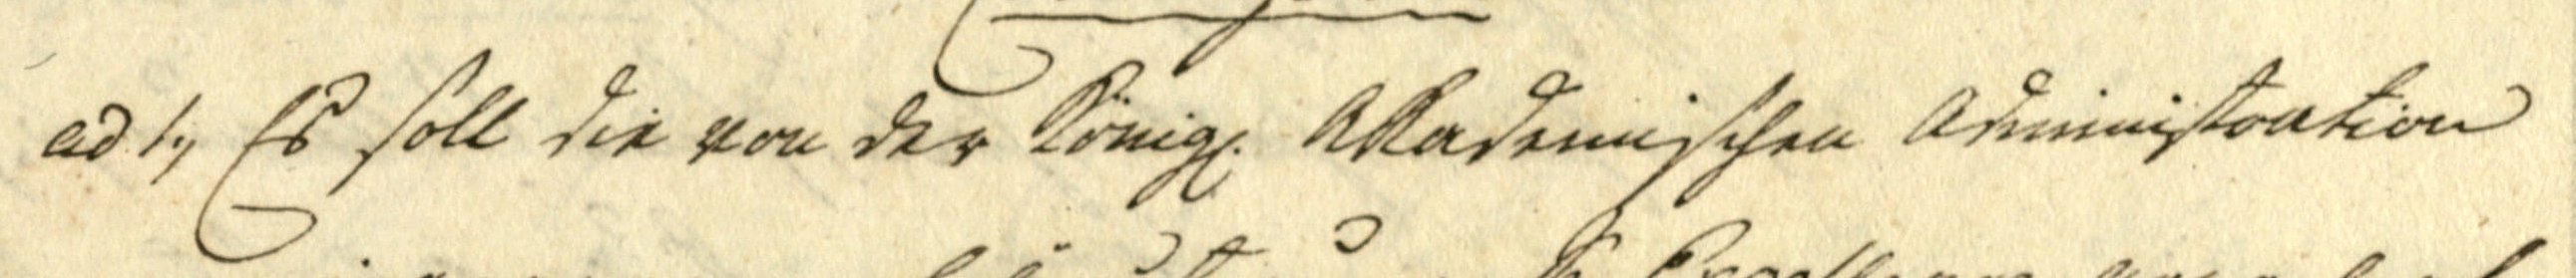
ad 1., Es soll die von der Königl. Akademischen Administration
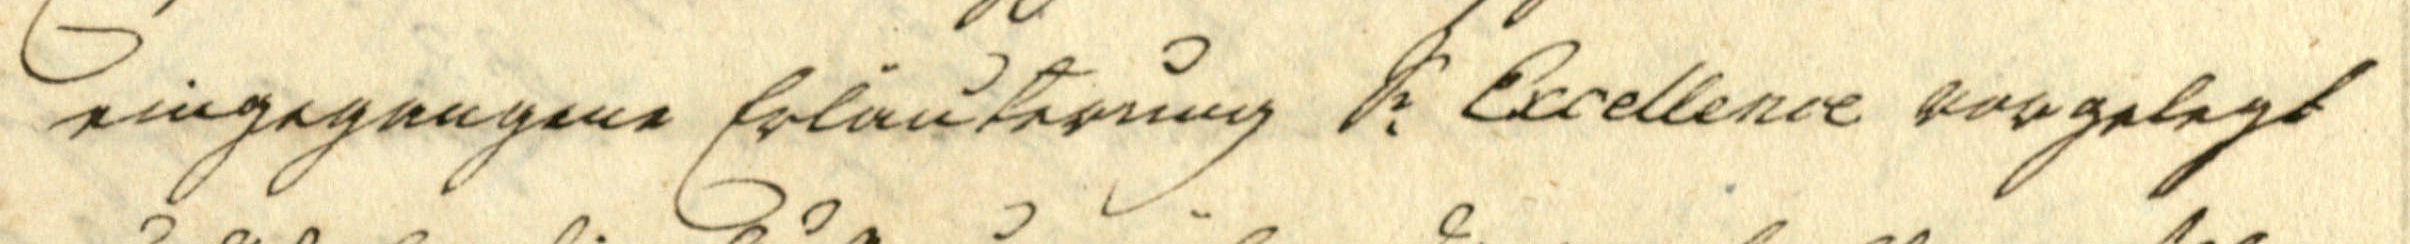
eingegangene Erläuterung Sr Excellence vorgelegt
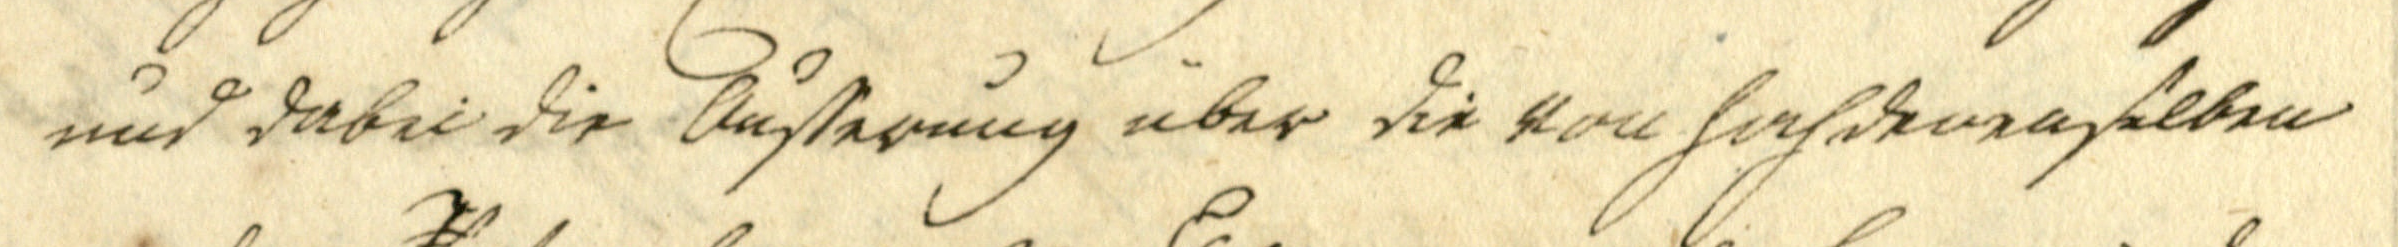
und dabei die Äusserung über die von Hochdenenselben
